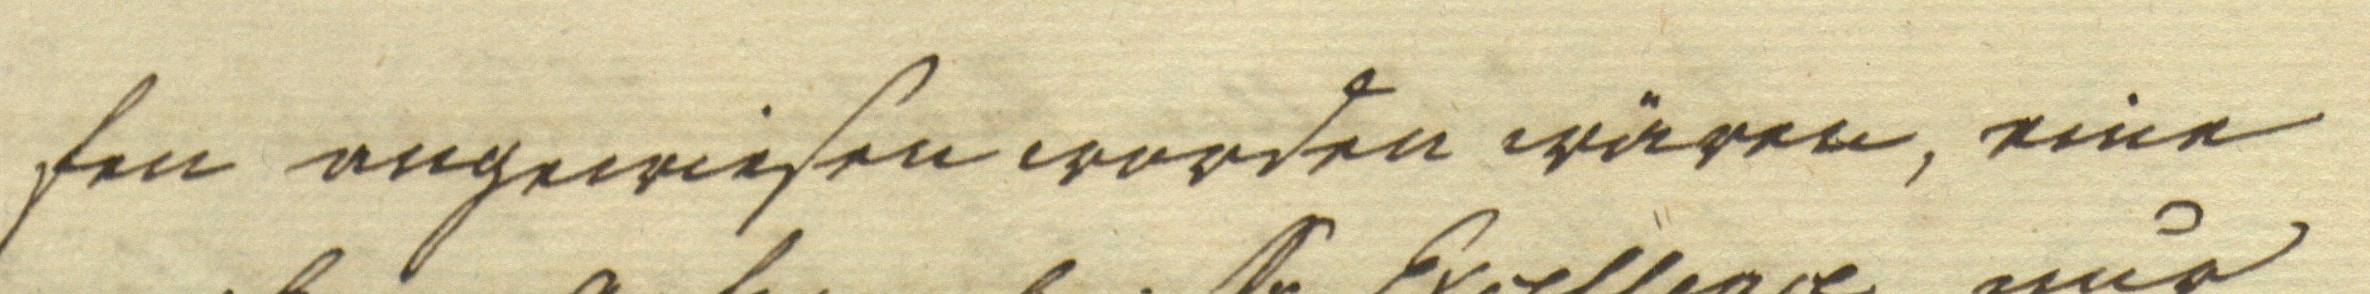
fen angewiesen worden wären, eine
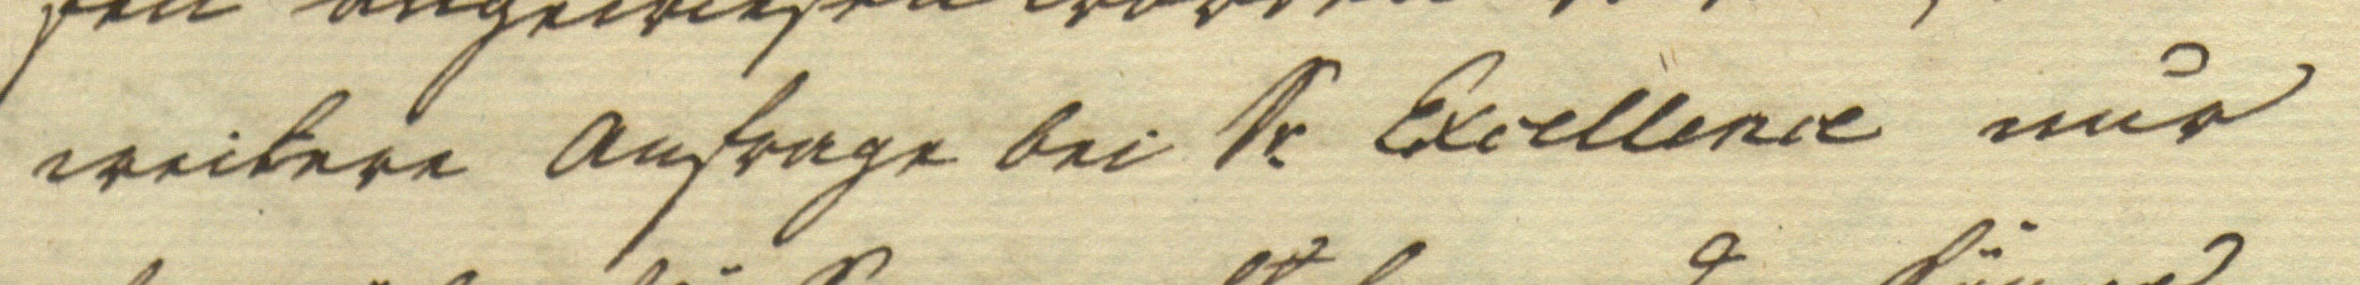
weitere Anfrage bei Sr Excellence nur
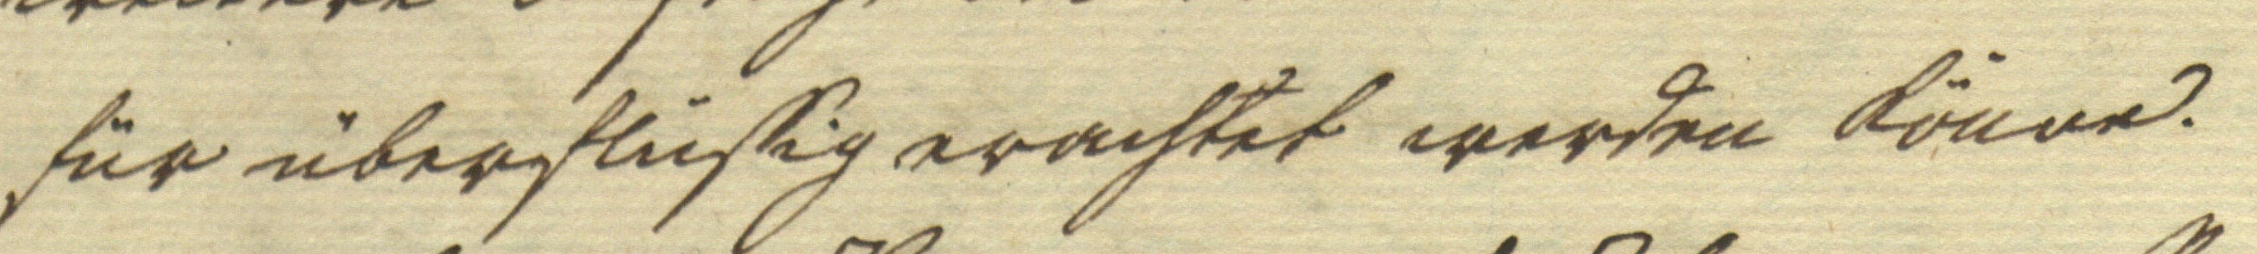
für überflüssig erachtet werden könne.
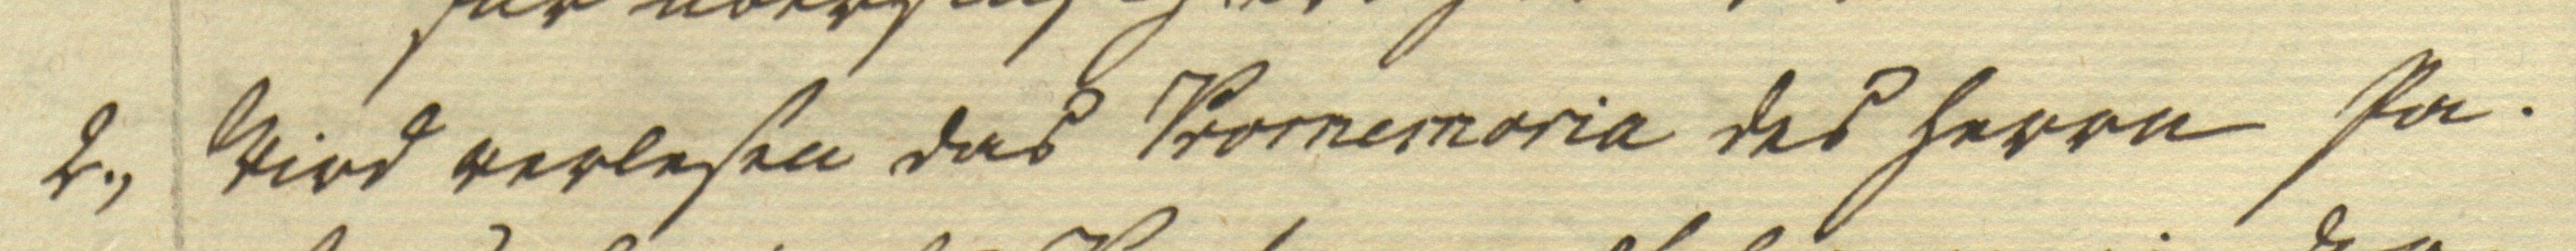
2., Wird verlesen das Promemoria des Herrn Pa¬
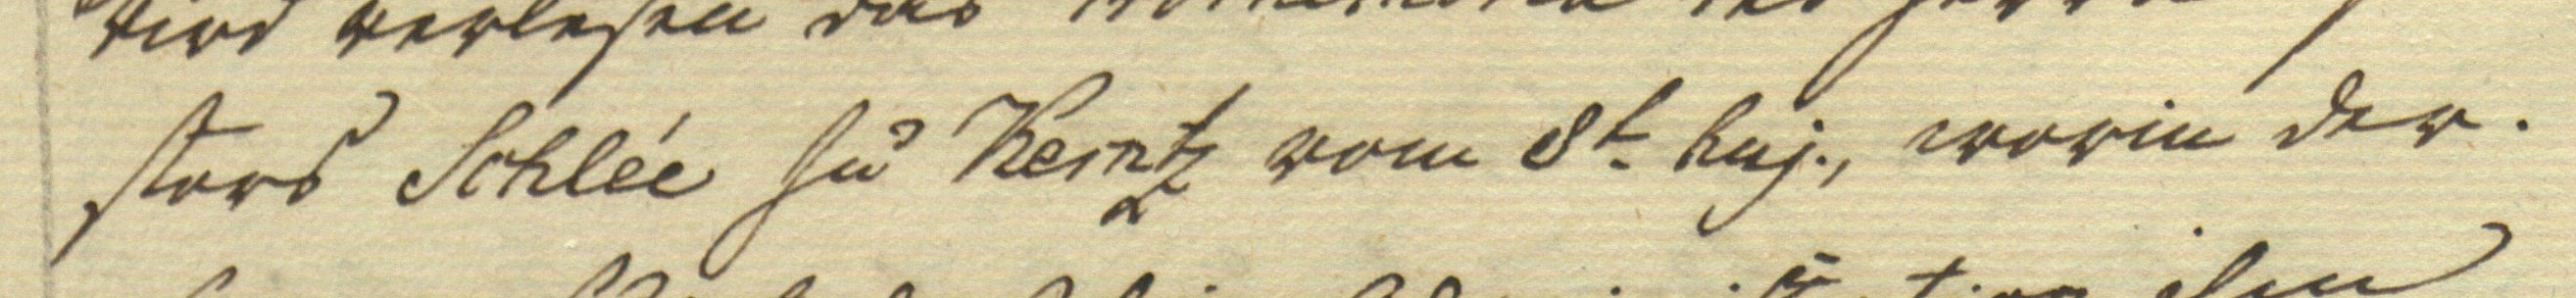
stors Schlée zu Kemtz vom 8 t huj., worin der¬
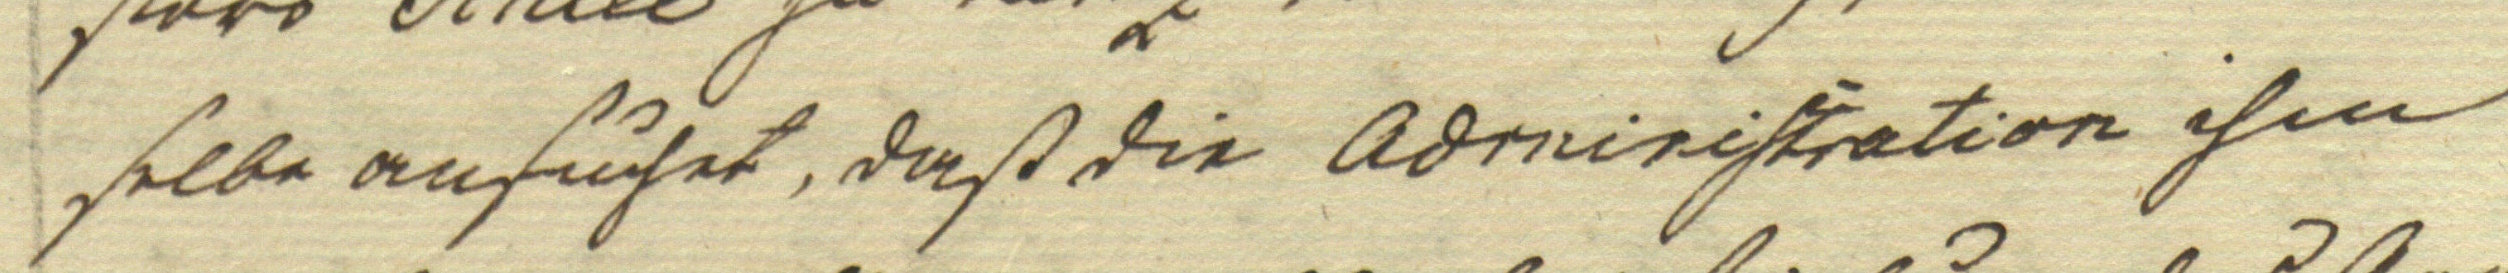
selbe ansuchet, daß die Administration ihm
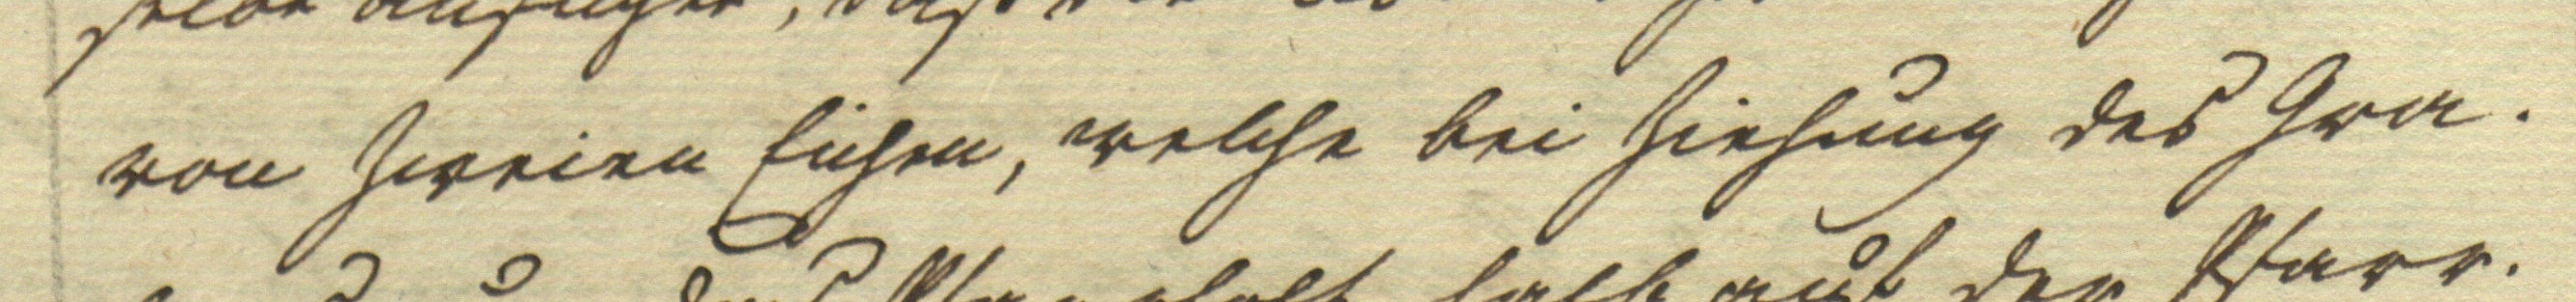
von zweien Eichen, welche bei Ziehung des Gra¬
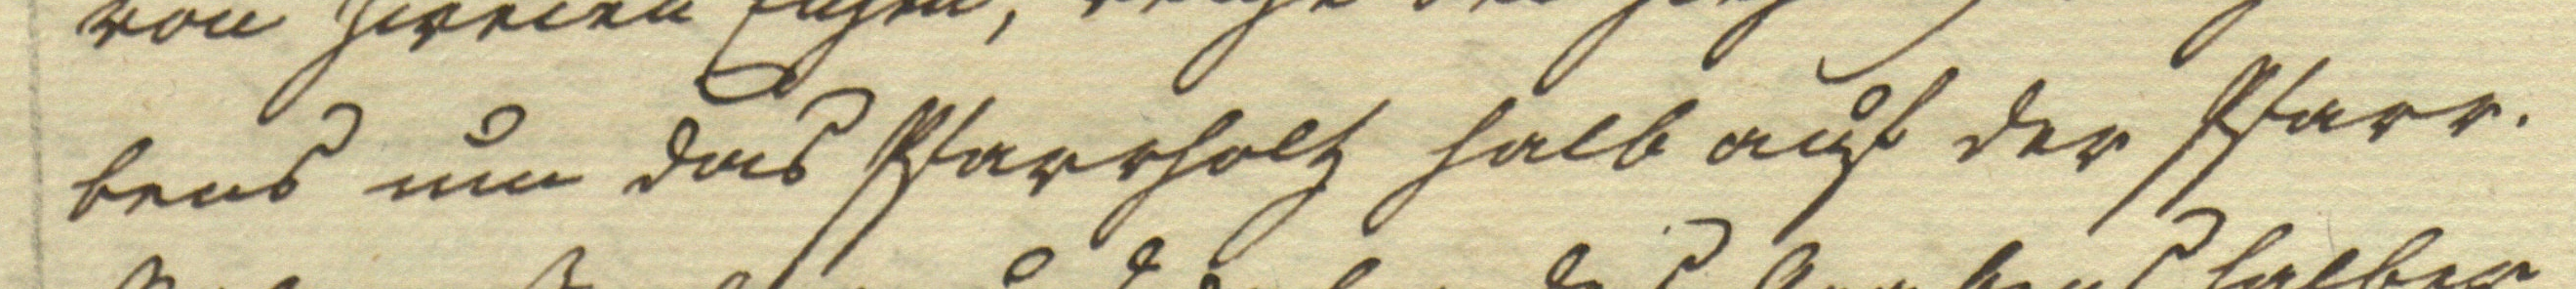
bens um das Pfarrholz halb auf der Pfarr¬
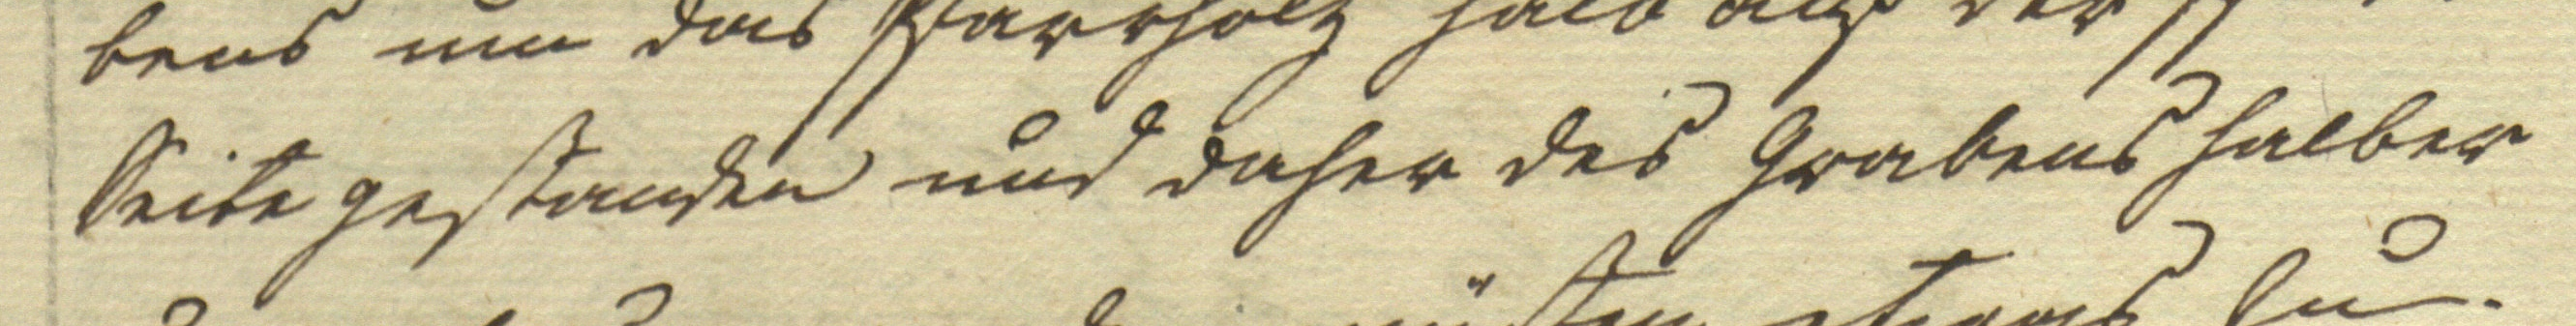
Seite gestanden und daher des Grabens halber
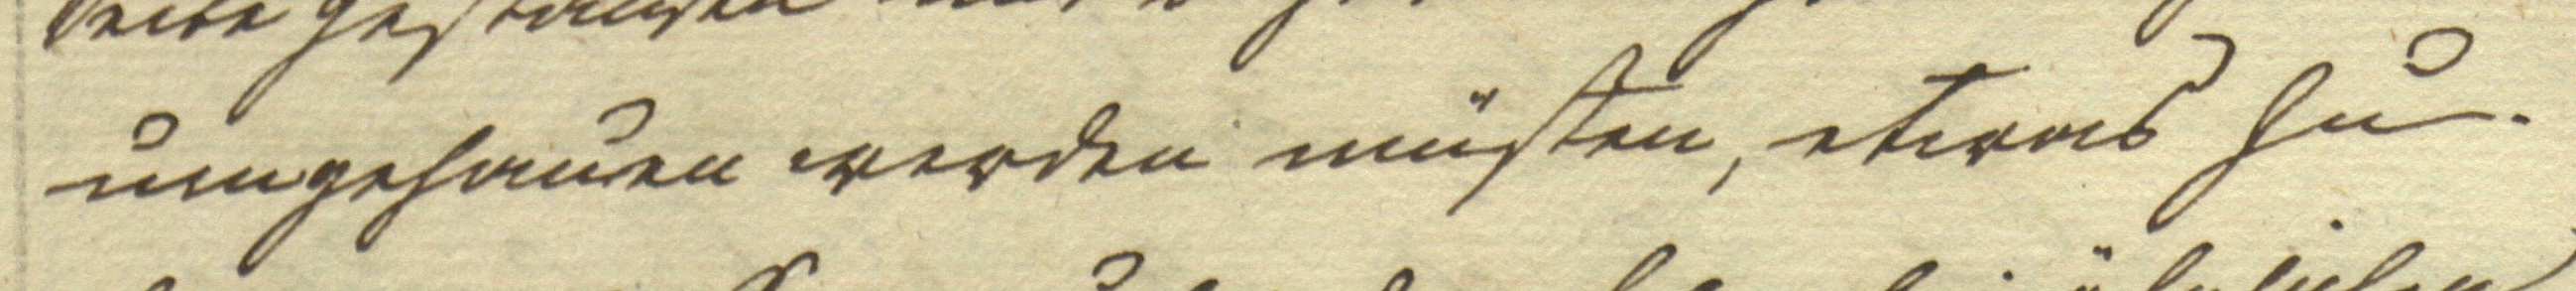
eingehen werden müsten, etwas zu¬
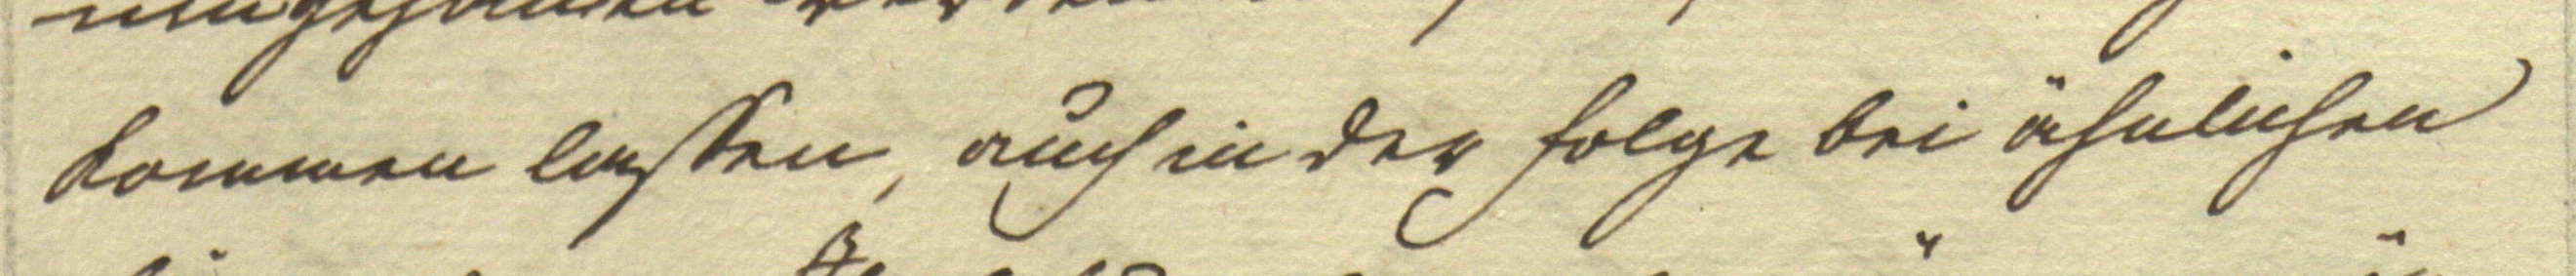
kommen lassen, auch in der Folge bei ähnlichen
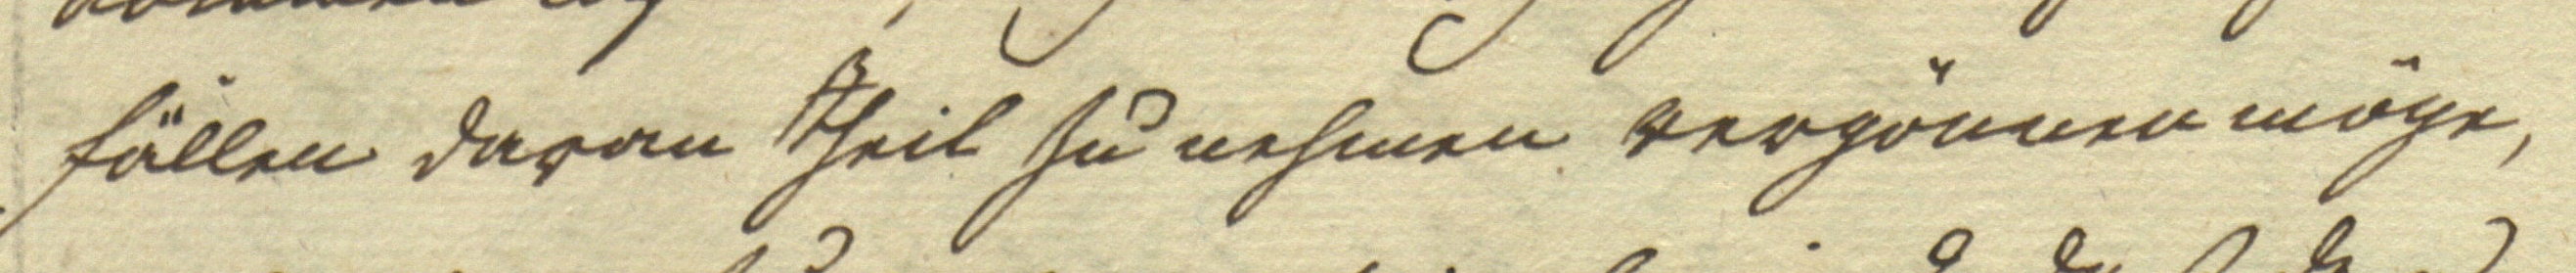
Fällen daran Theil zu nehmen vergönnen möge,
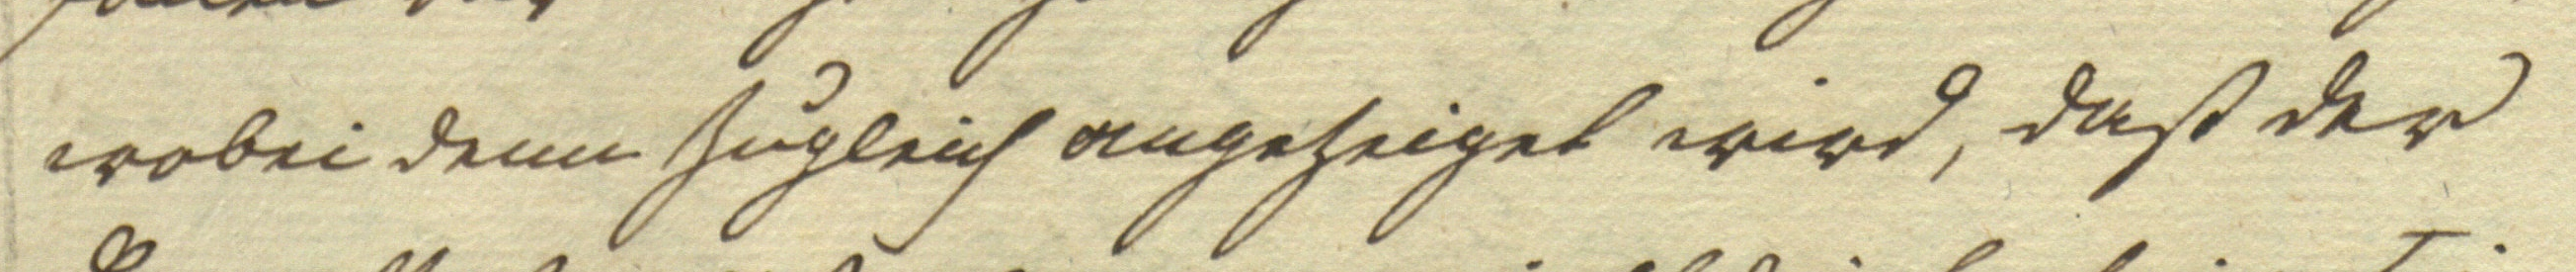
wobei denn zugleich angezeiget wird, daß der
